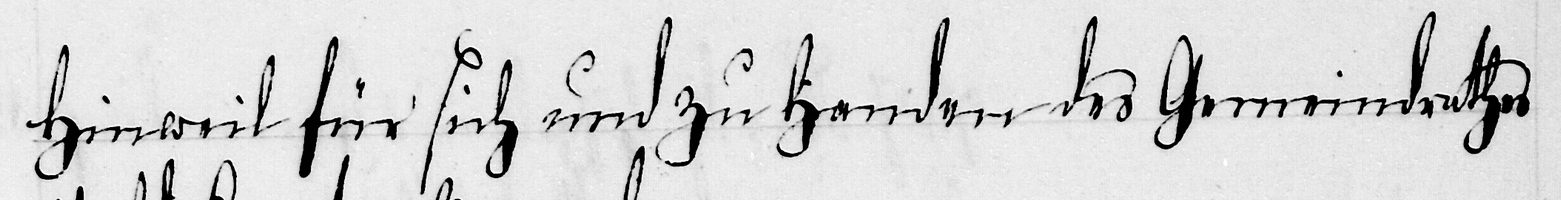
Hinweil für sich und zu Handen des Gemeindrathes
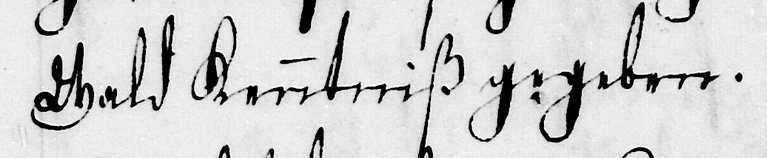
Wald Kenntniß gegeben.
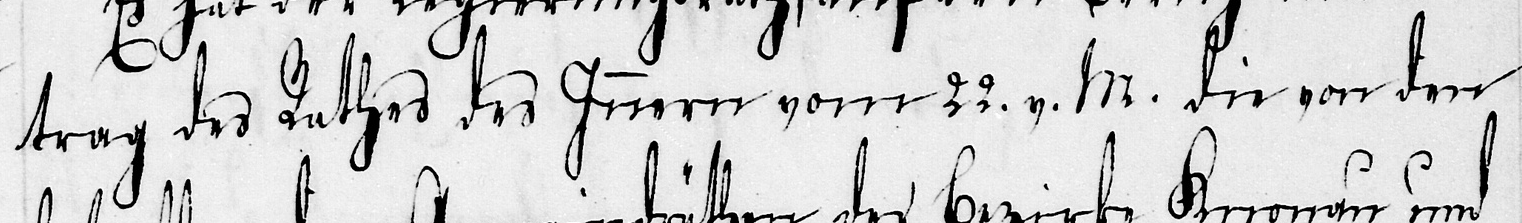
trag des Rathes des Innern vom 22. v. M. die von den
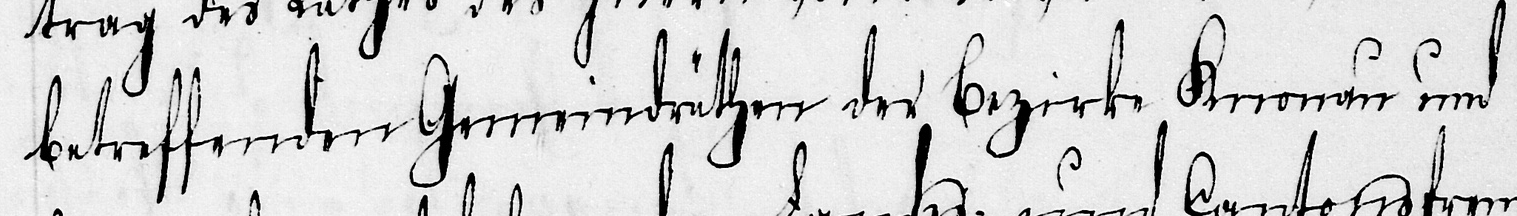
betreffenden Gemeindräthen der Bezirke Knonau und
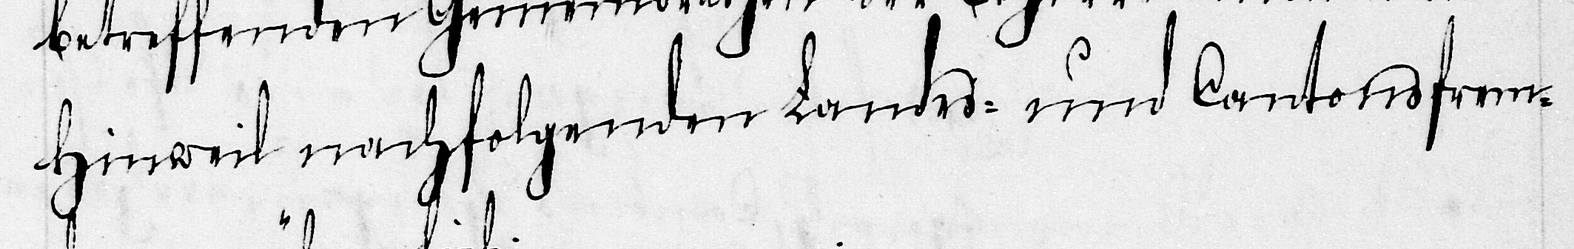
Hinweil nachfolgenden Landes- und Cantonsfrem¬
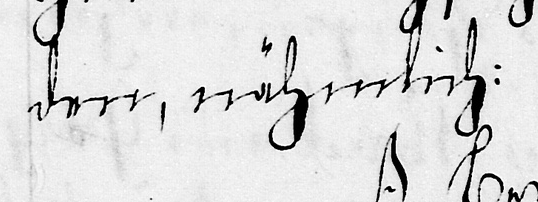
den, nähmlich:
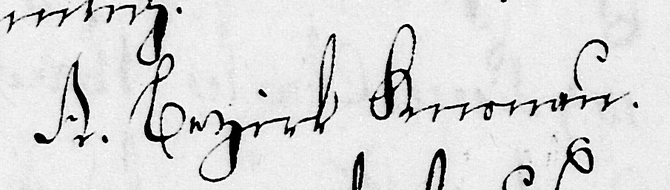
A. Bezirk Knonau.
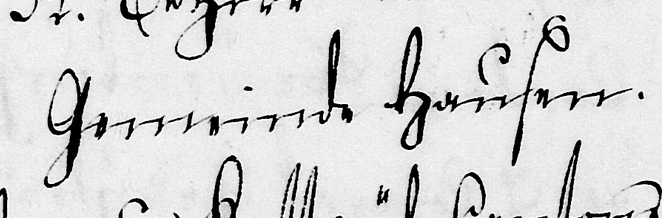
Gemeinde Hausen.
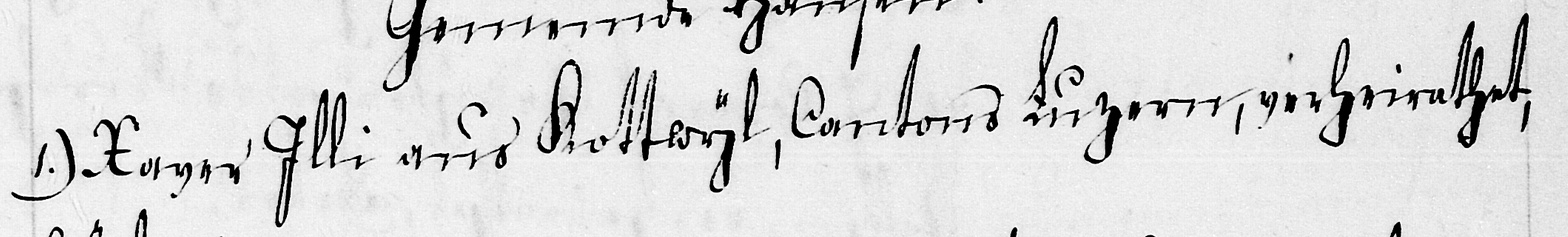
1.) Xaver Illi aus Kottwyl, Cantons Luzern, verheirathet,
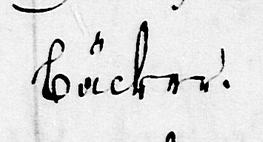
Bäcker.
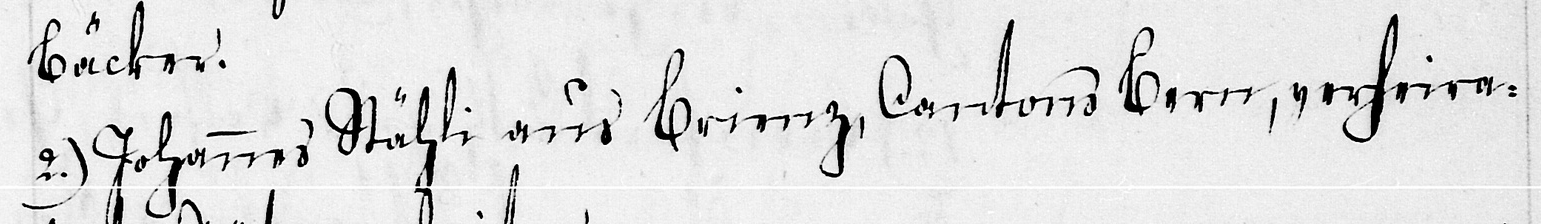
2.) Johannes Stähli aus Brienz, Cantons Bern, verheira¬
